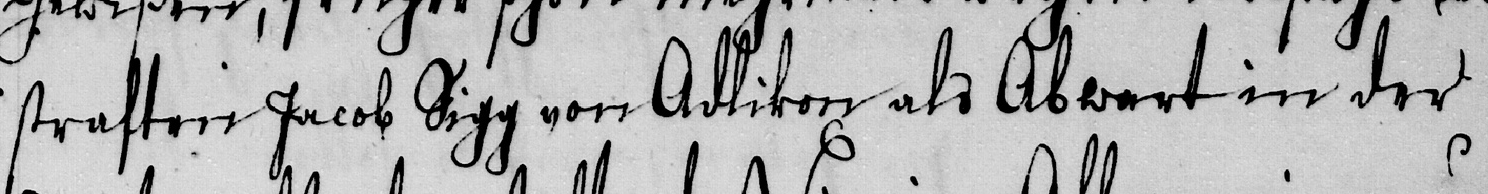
straften Jacob Sigg von Adlikon als Abwart in der
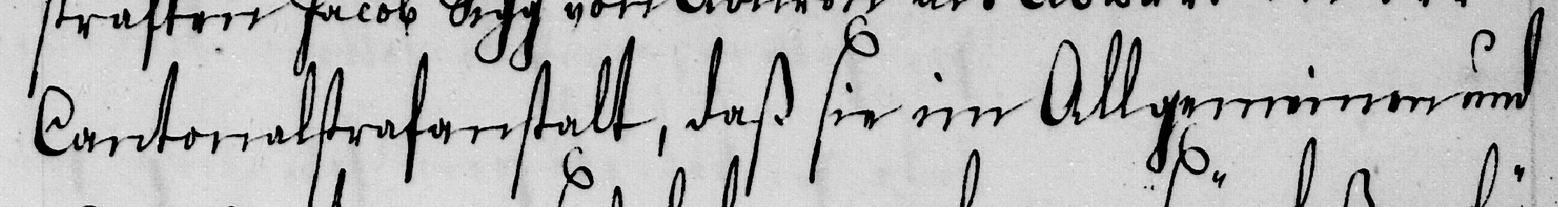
Canonalstrafanstalt, daß sie im Allgemeinen und
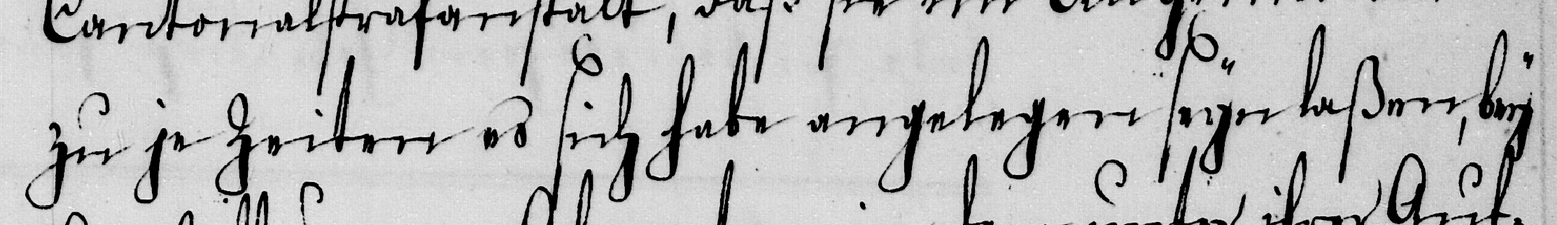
zu je Zeiten es sich habe angelegen seyn laßen, bey
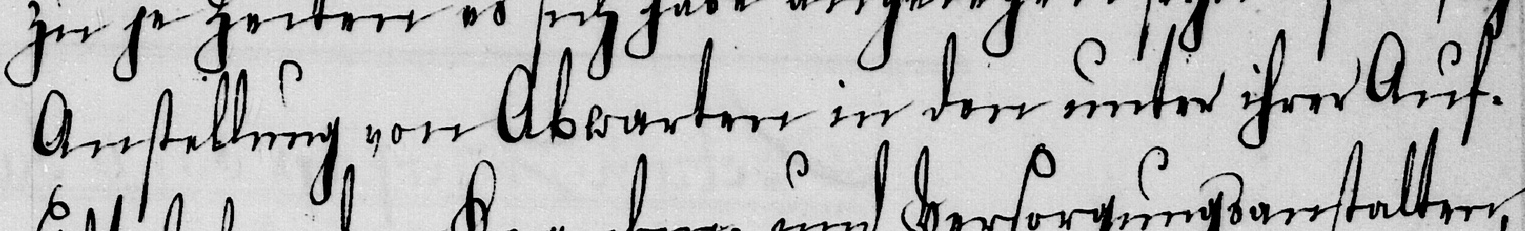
Anstellung von Abwarten in den unter ihrer Auf¬
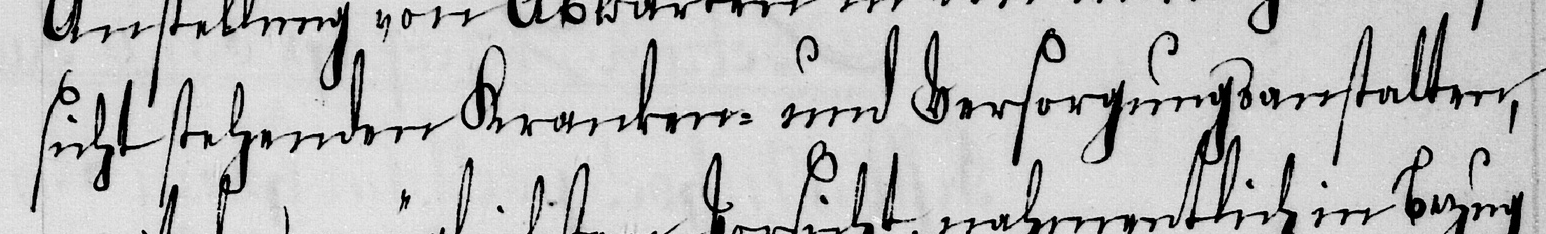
sicht stehenden Kranken- und Versorgungsanstalten,
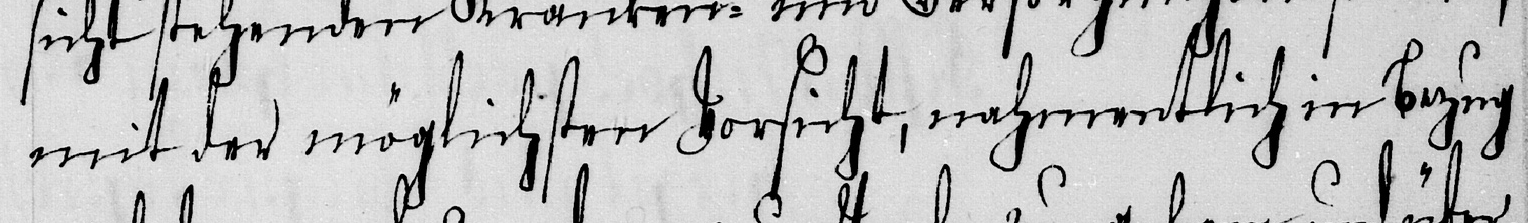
mit der möglichsten Vorsicht, nahmentlich in Bezug
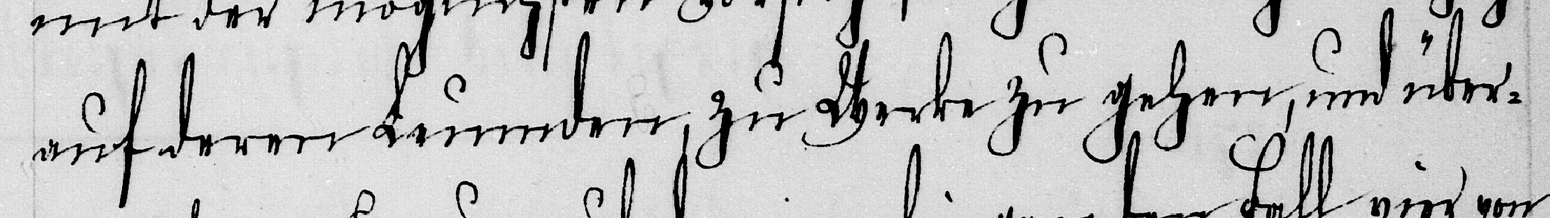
auf deren Leumden, zu Werke zu gehen, und über¬
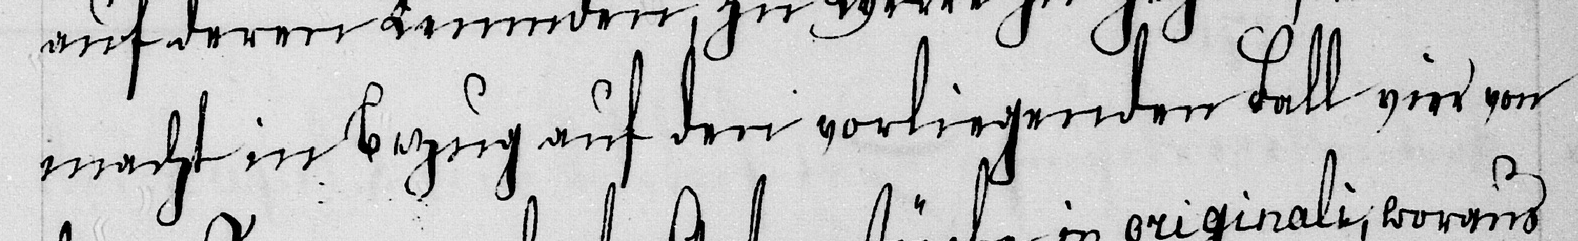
macht in Bezug auf den vorliegenden Fall vier von
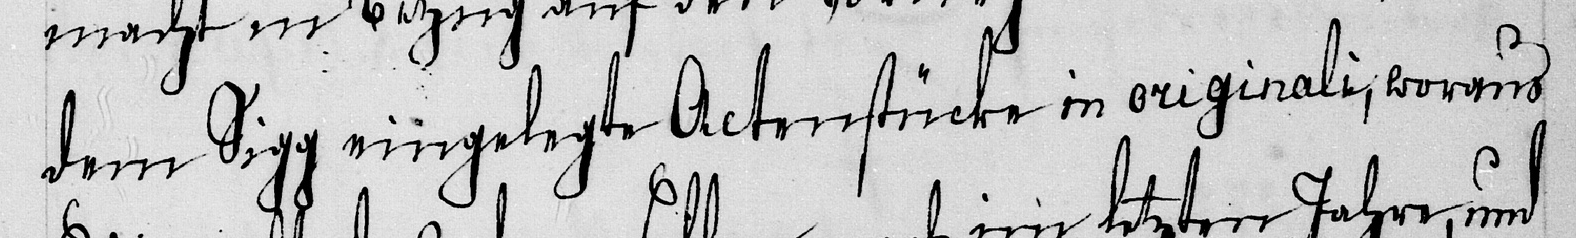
dem Sigg eingelegten Actenstücken in originali, woraus
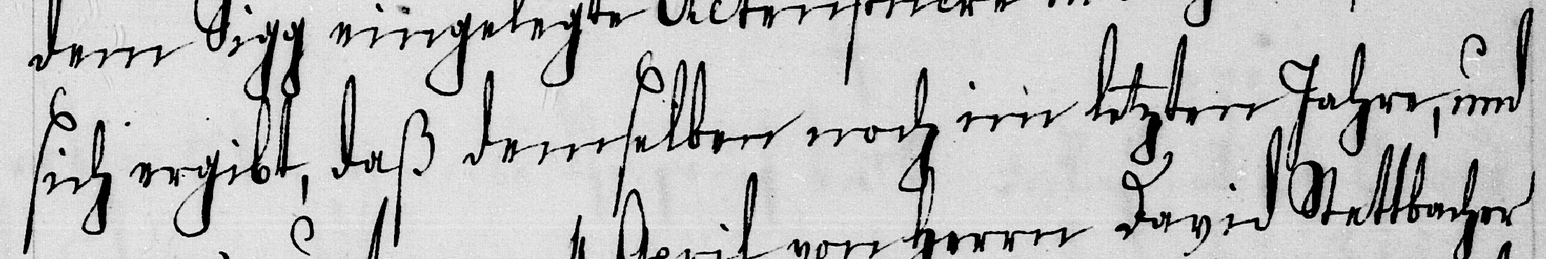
sich ergibt, daß demselben noch im letzten Jahre, und
